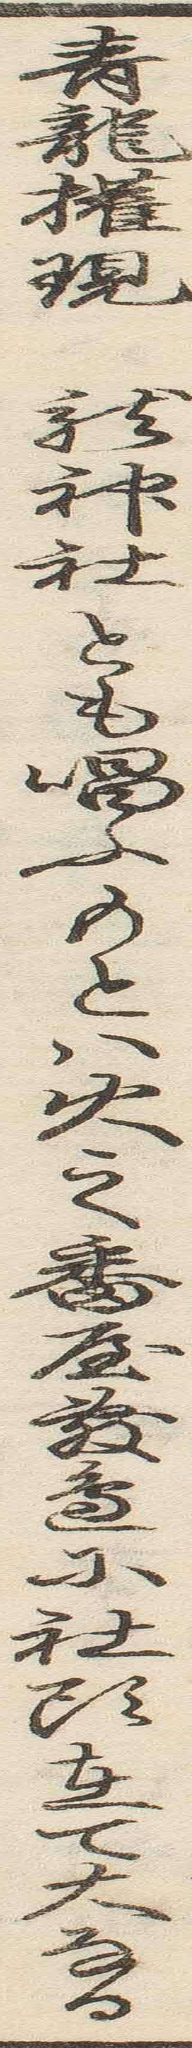青龍權現龍神社とも唱ふもとは火之番屋敷邊に社頭在て大なる
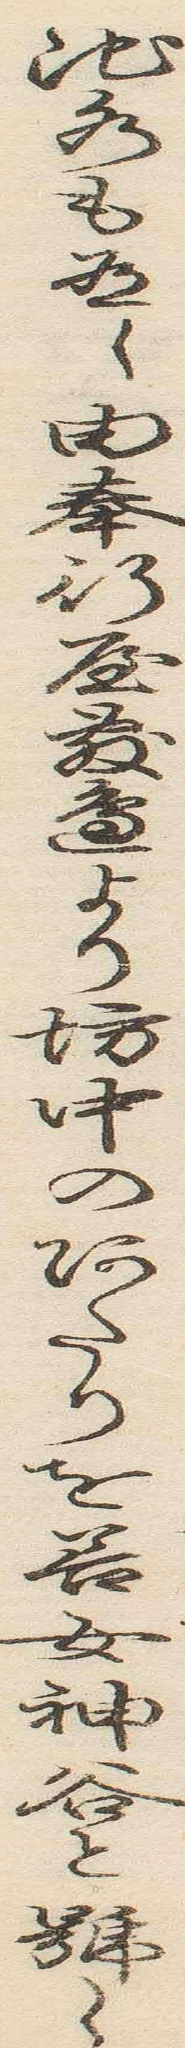池水も有し由奉行屋敷邊より坊中のあたりを善女神谷と號し
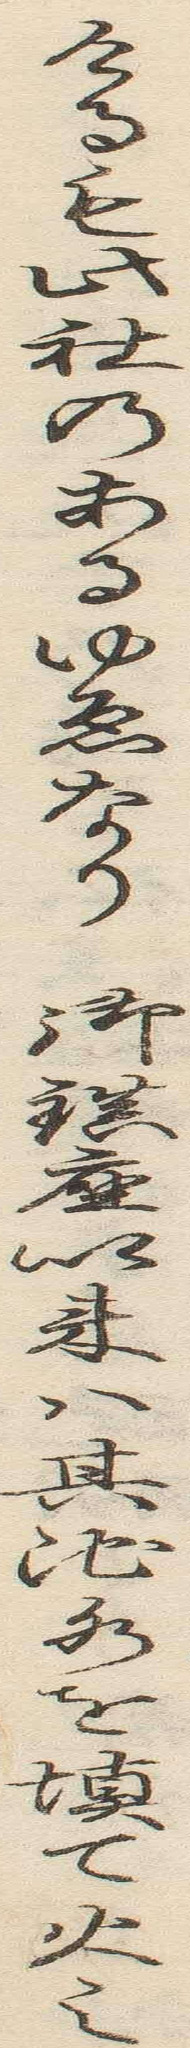けるも此社のあるゆゑなり御鎮座以來は其池水を填て火之
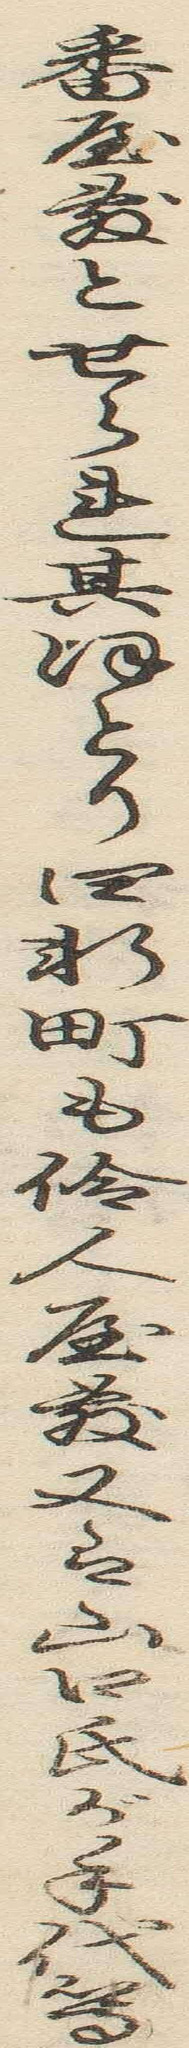番屋敷とせられ其ほとり四軒町も伶人屋敷又は山口氏が手代等
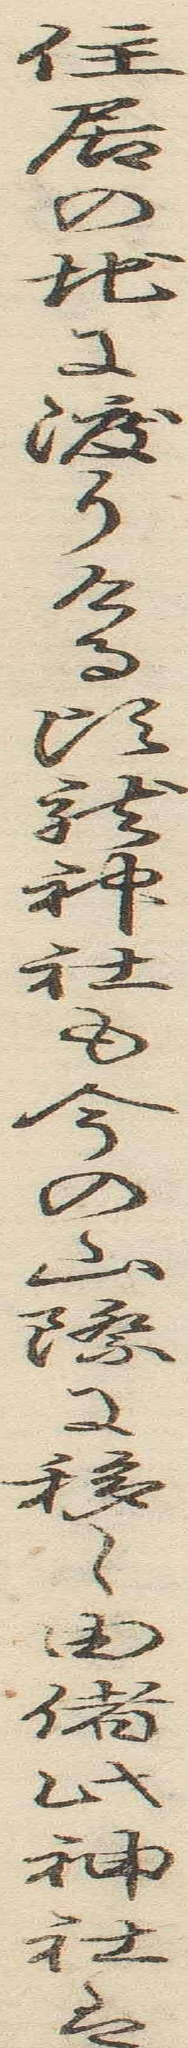住居の地に渡りける頃龍神社も今の山際に移し由偖此神社は
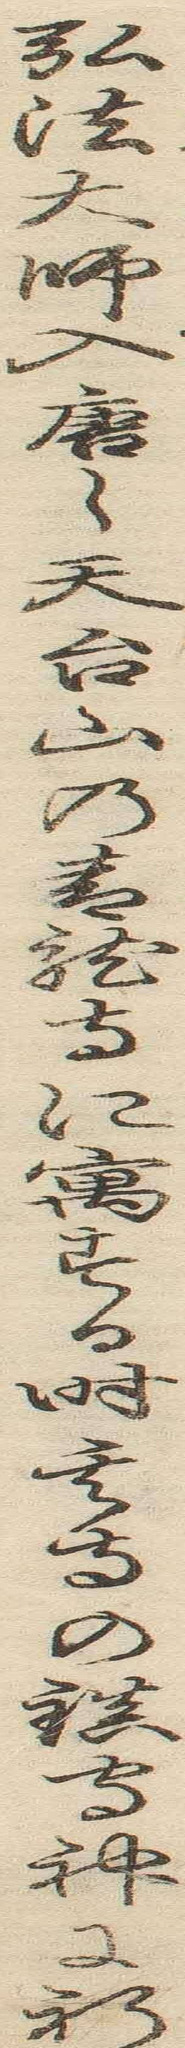弘法大師入唐し天台山の青龍寺に寓する时其寺の鎮守神に祈

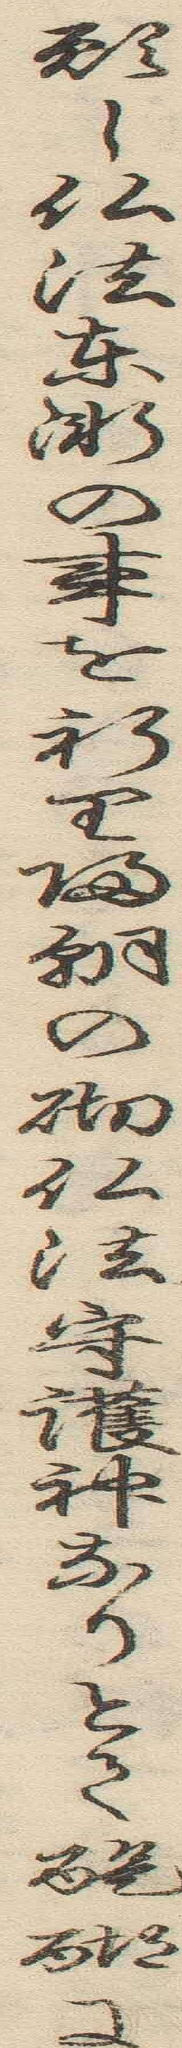願し仏法東漸の事を祈り帰朝の砌仏法守護神なりとて醍醐に
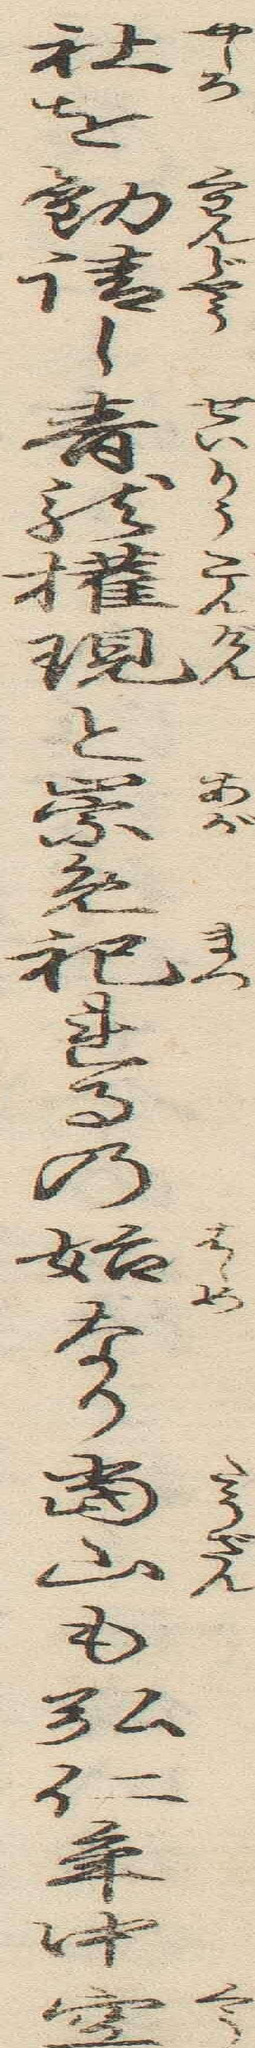社を勸請し青龍權現と崇め祀れるの始なり當山も弘仁年中空
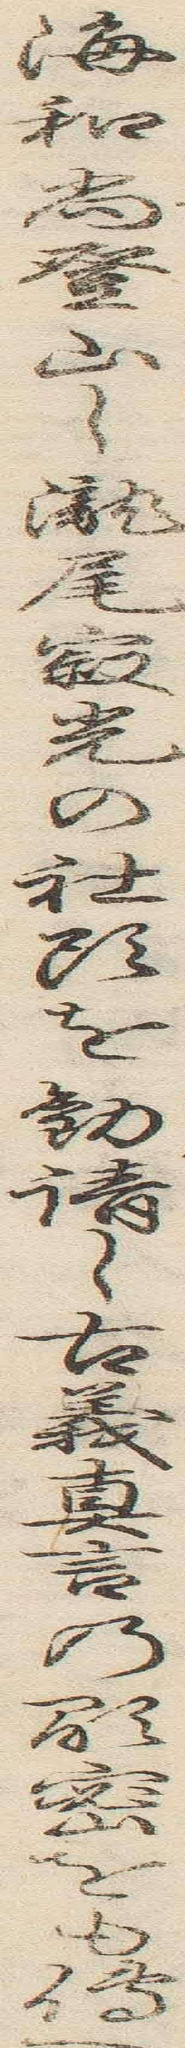海和尚登山し瀧尾寂光の社頭を勸請し古義真言の顕密をも傳へ
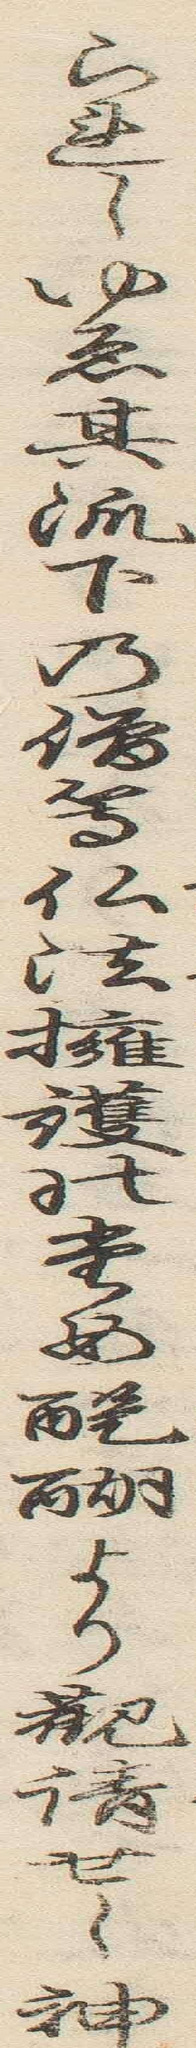られしゆゑ其派下の僧等仏法擁護のため醍醐より勸請せし神
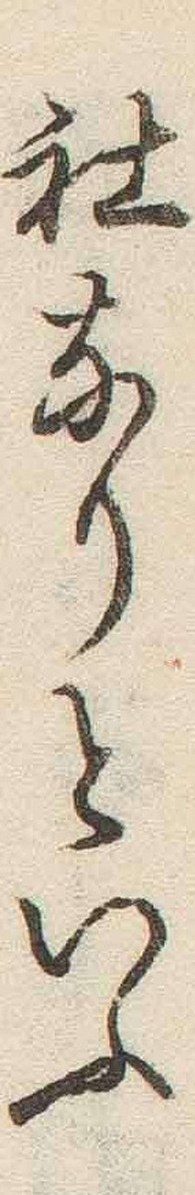社なりといふ
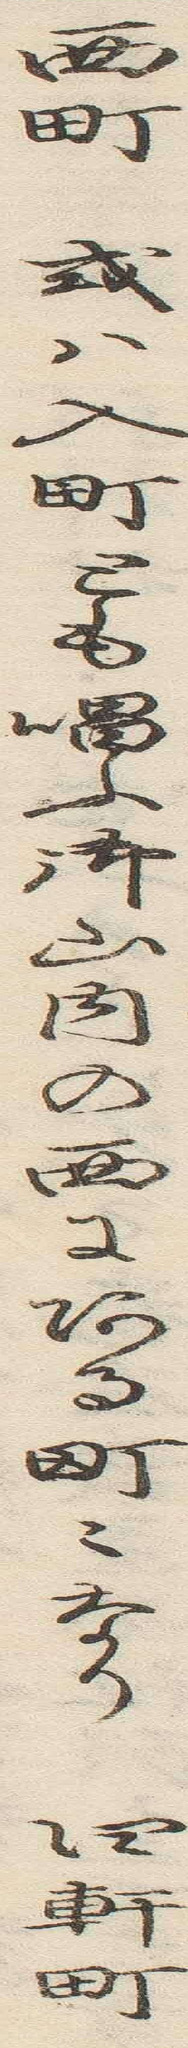西町或は入町とも唱ふ御山内の西にある町〻なり四軒町
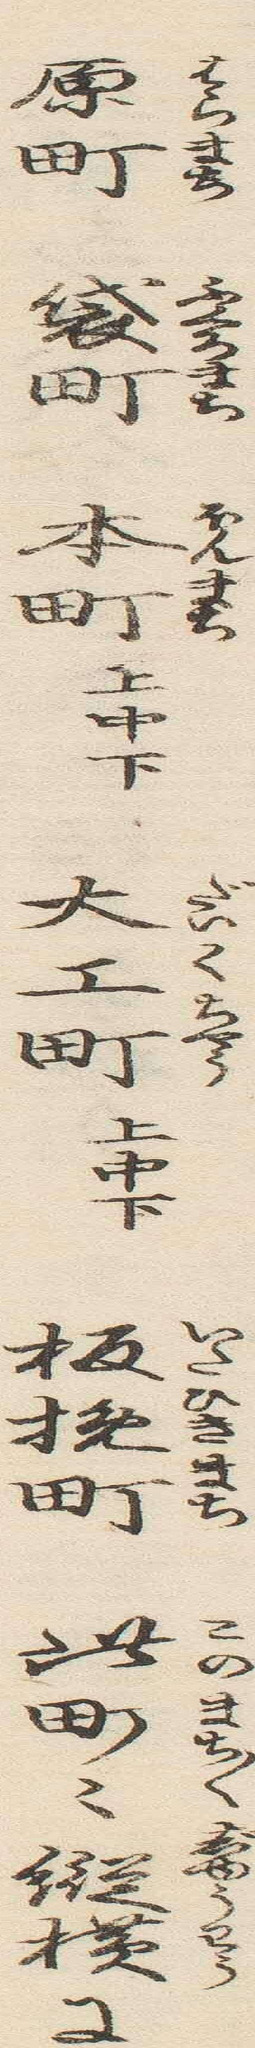原町袋町本町上中下大工町上中下板挽町此町〻縦横に
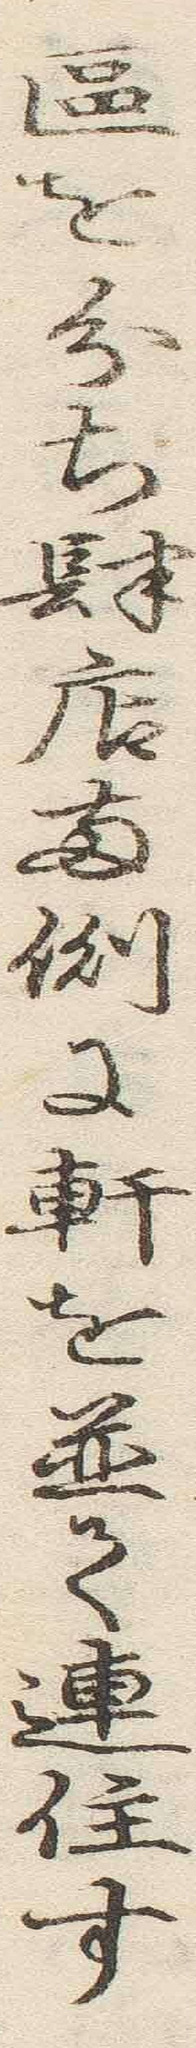區を分ち肆店両側に軒を並て連住す
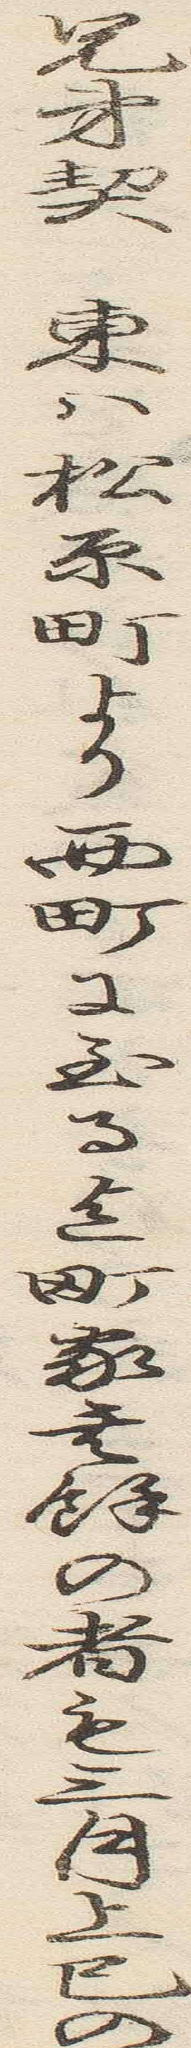兄㐧契東は松原町より西町に至る迄町家其餘の者も三月上巳の
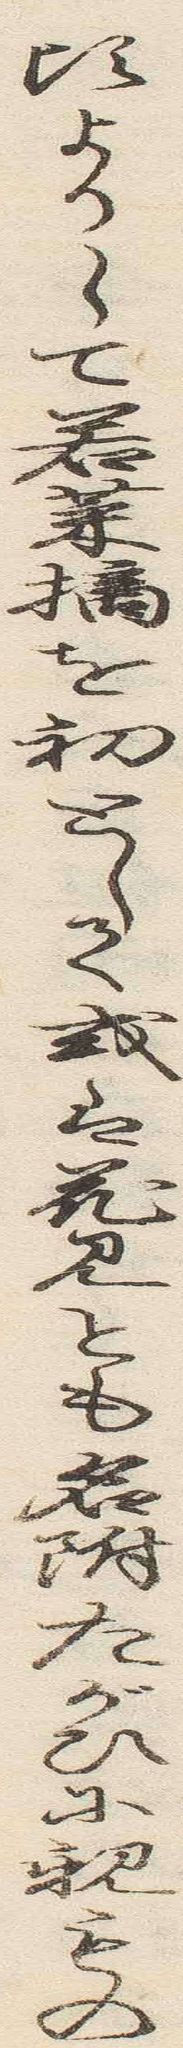頃よりして若菜摘を初として或は花見とも名附たがひに親もの
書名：日光山志
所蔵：東京学芸大学附属図書館 国文学研究資料館
